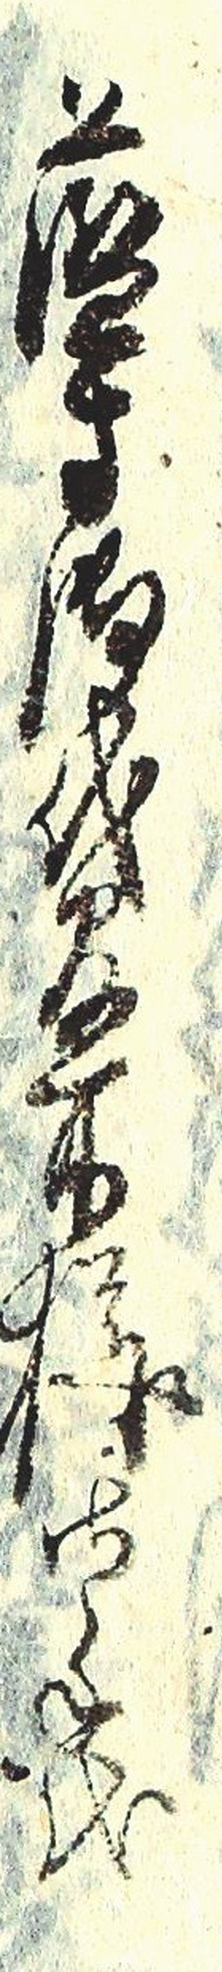藍方御代官所様御手代
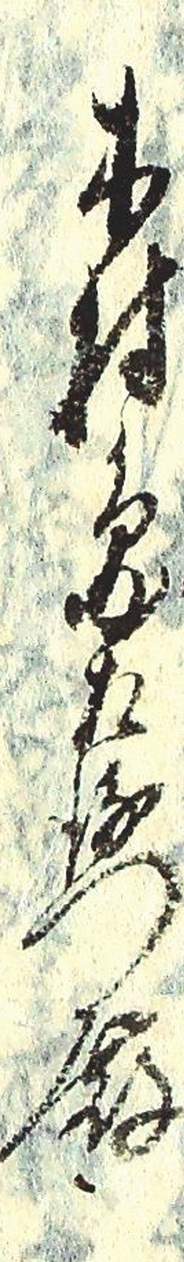木村円左衛門殿
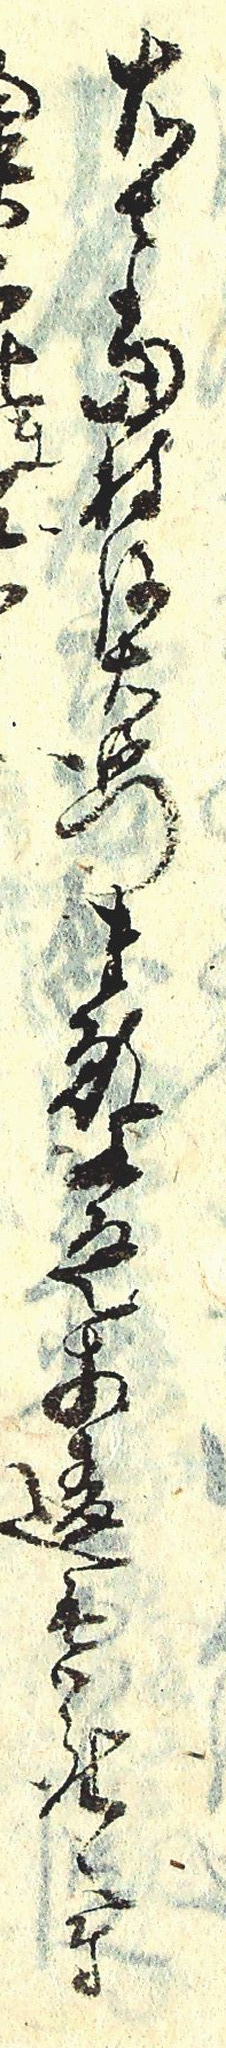右は当村弥右衛門奉願上通相違無御座候に付
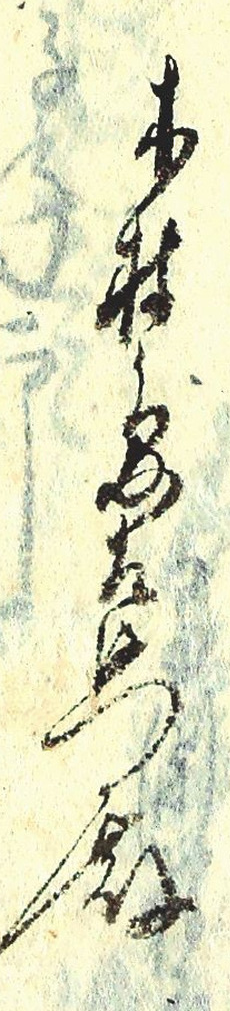木村円左衛門殿
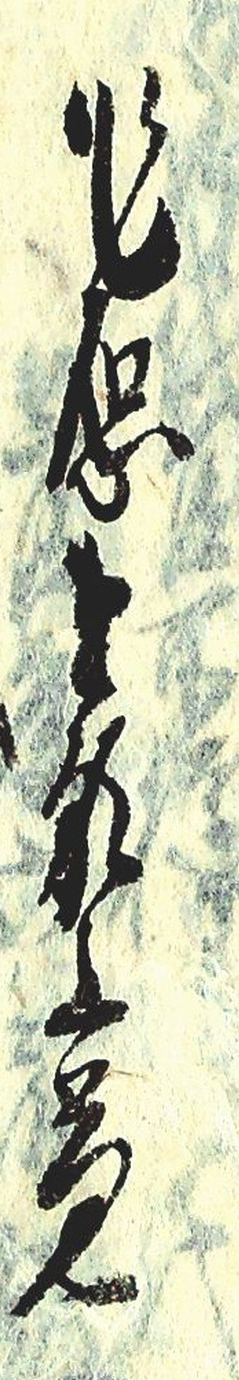乍恐奉願上覚
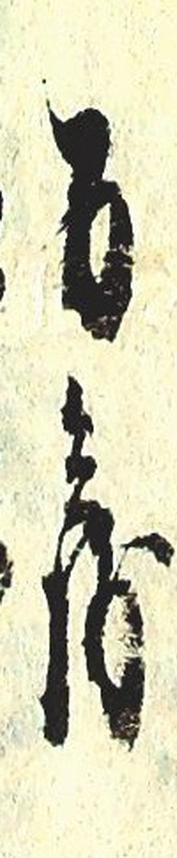万兵衛
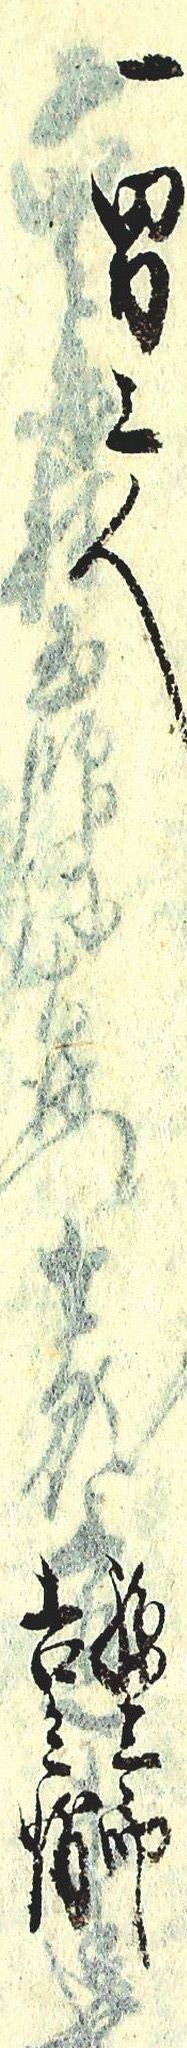一男三人孫三郎
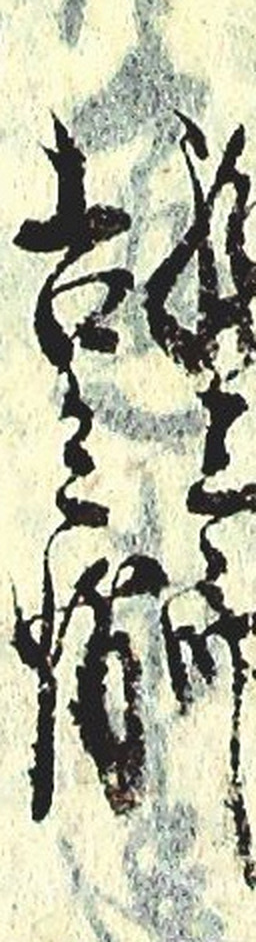吉兵衛
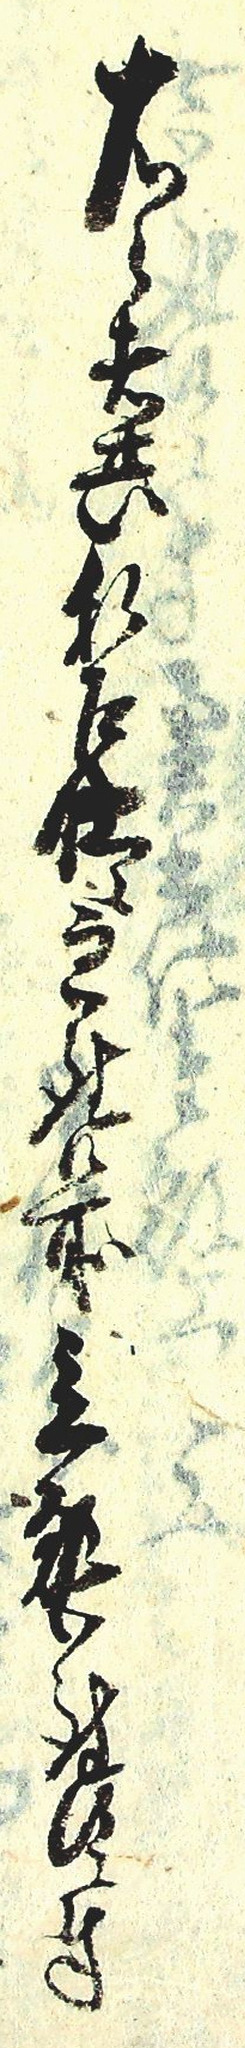右之者共私召仕にて御座候所立願御座候に付
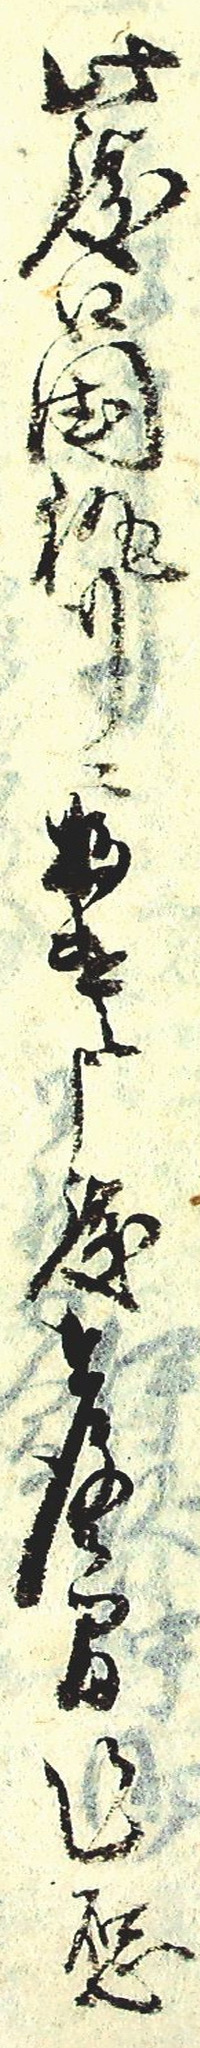此度四国執行に指遣し申度奉存候間乍恐
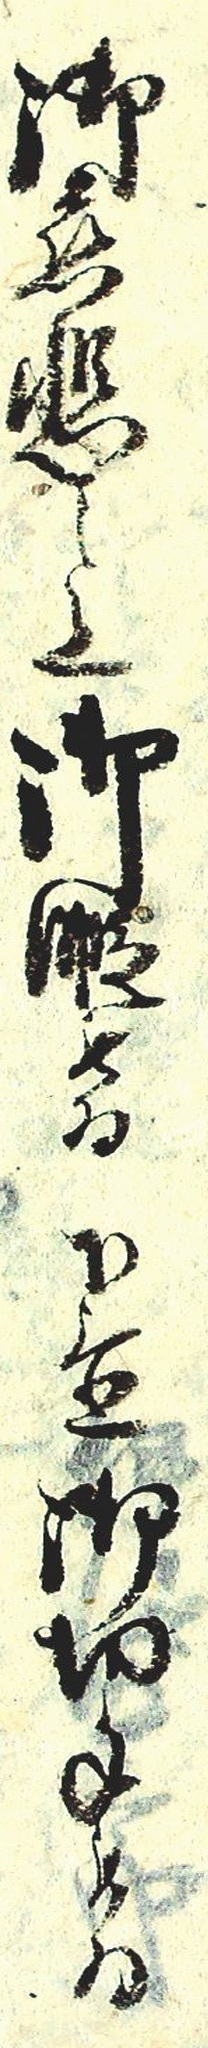御慈悲之上御暇被為下置御切手被為
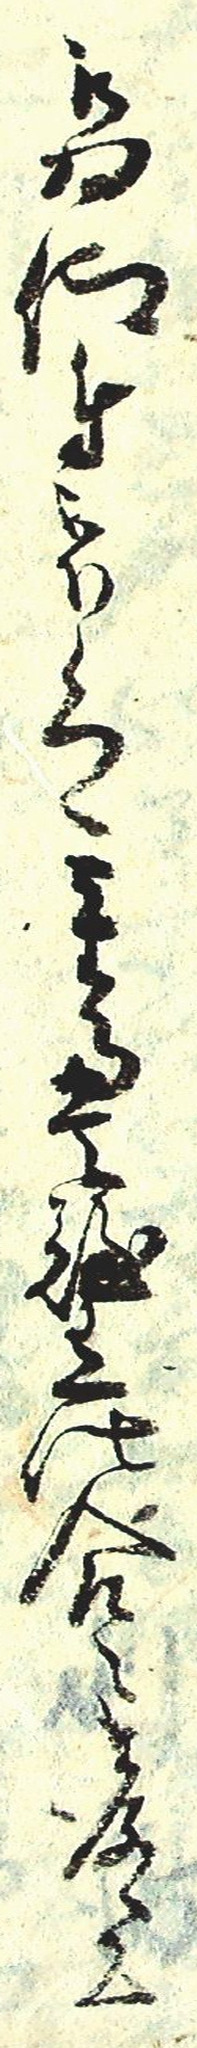被為仰付被下候はゝ重畳難有仕合に奉存候以上
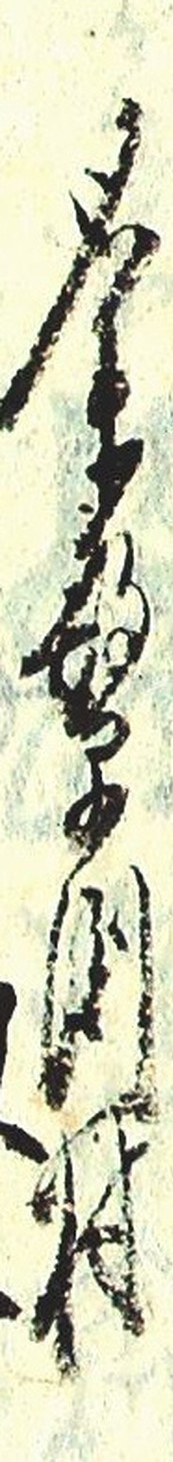名東郡早淵村
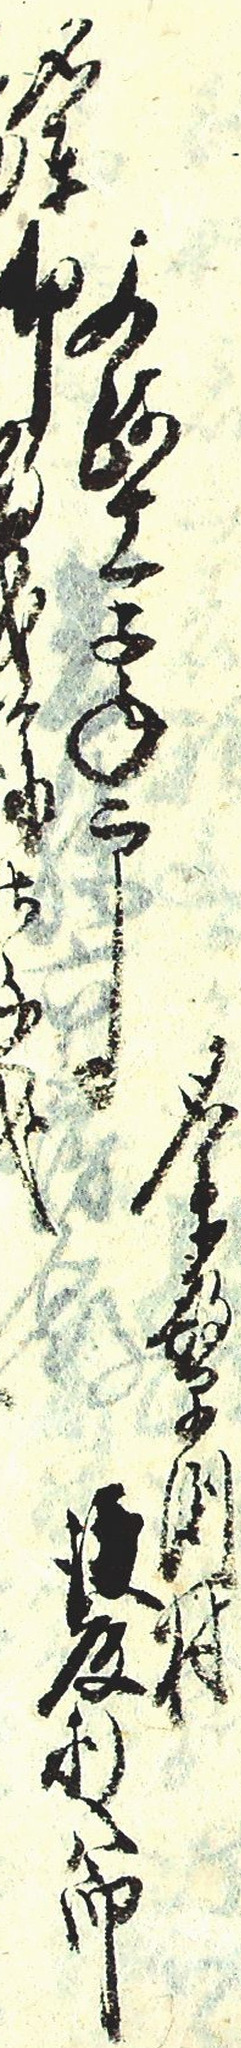文政十一子年二月後藤利八郎
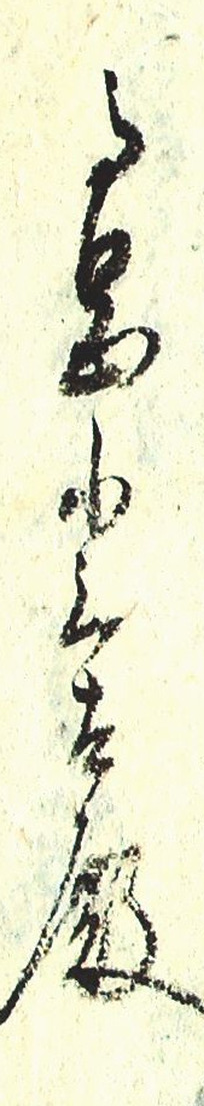高岡小三太殿

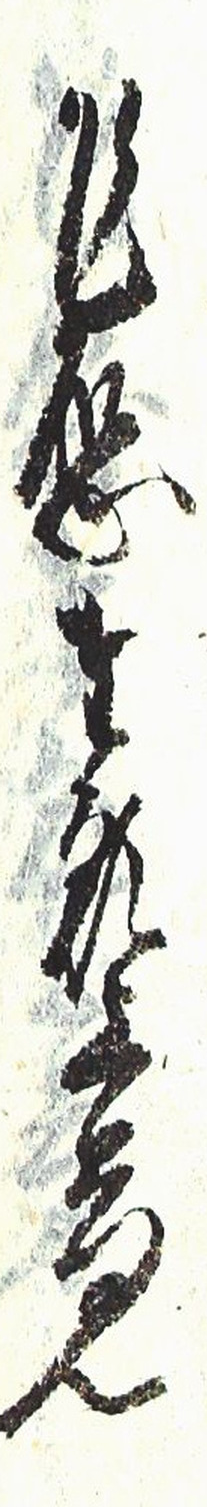乍恐奉願上覚
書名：諸御願書控(弐番）
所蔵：鳴門教育大学 Naruto University of Education
